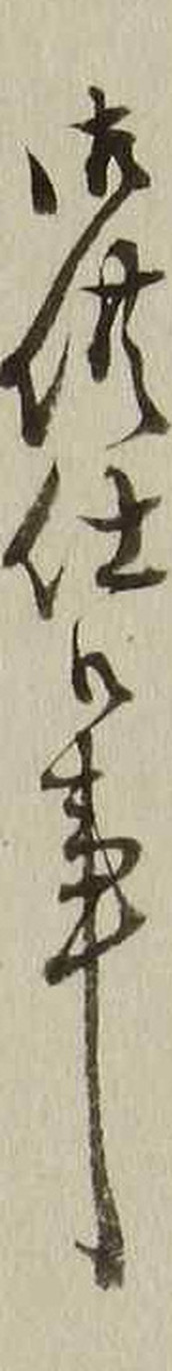御供仕候事
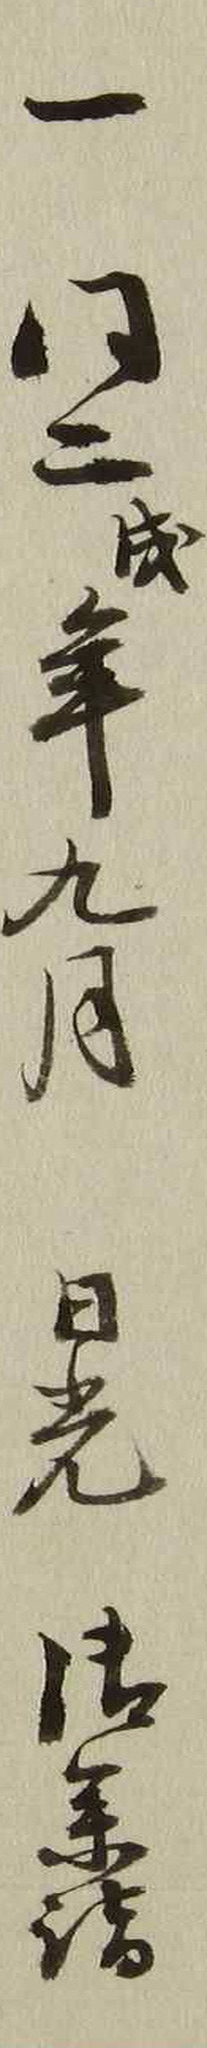一同二戌年九月日光御参詣
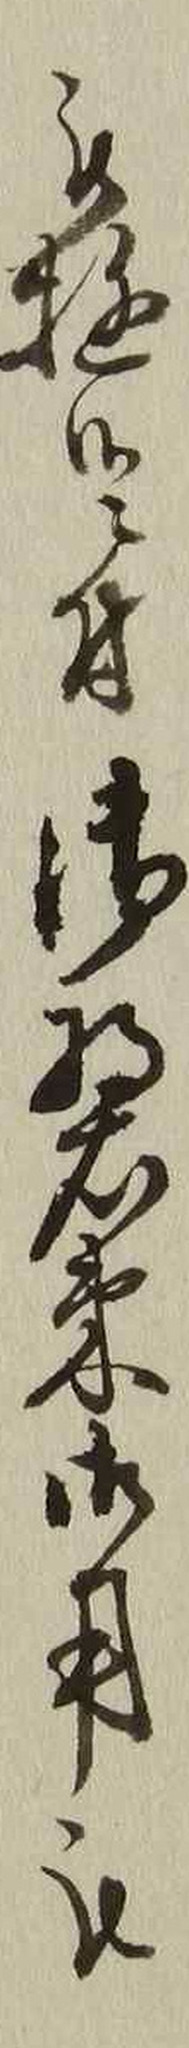被遊候ニ付御装束御用被
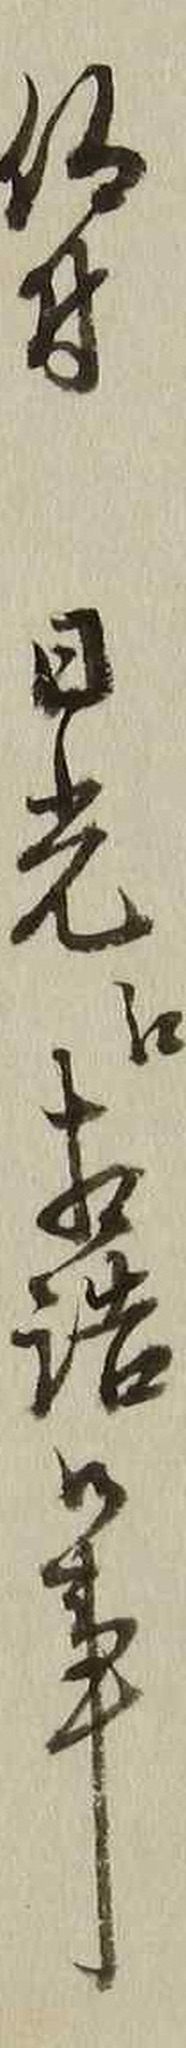仰付日光江相詰候事
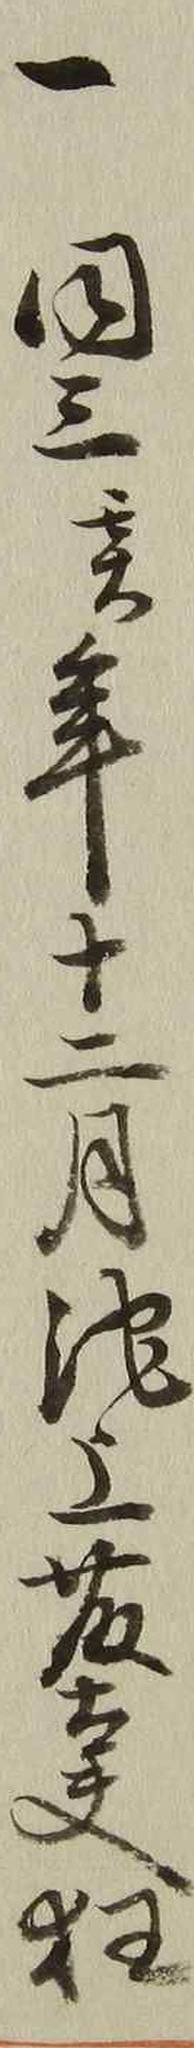一同三亥年十二月池上藤太夫狂
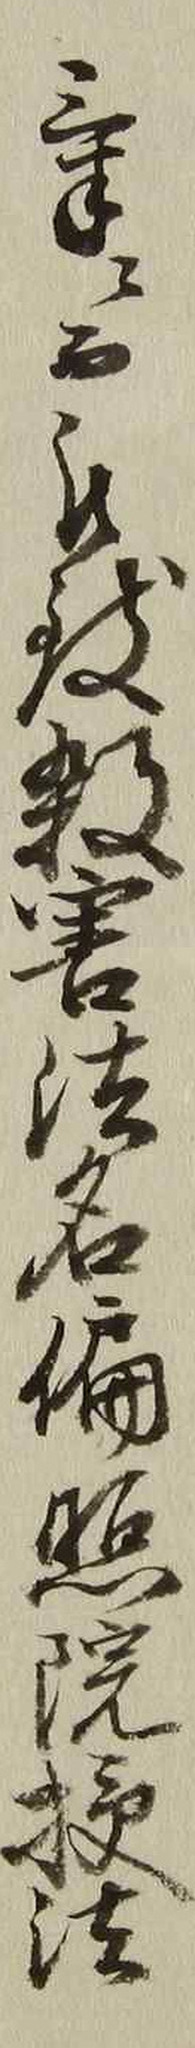気ニ而被致殺害法名偏照院授法
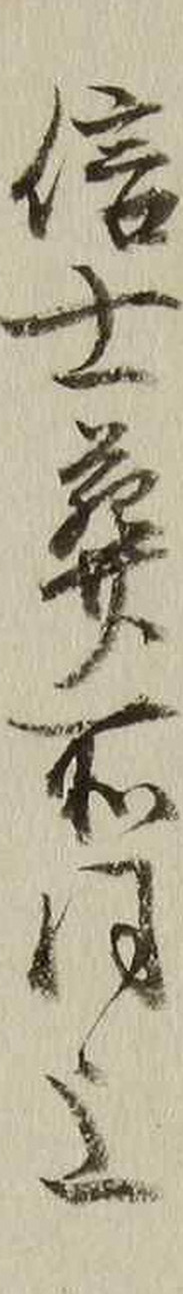信士葬所同上
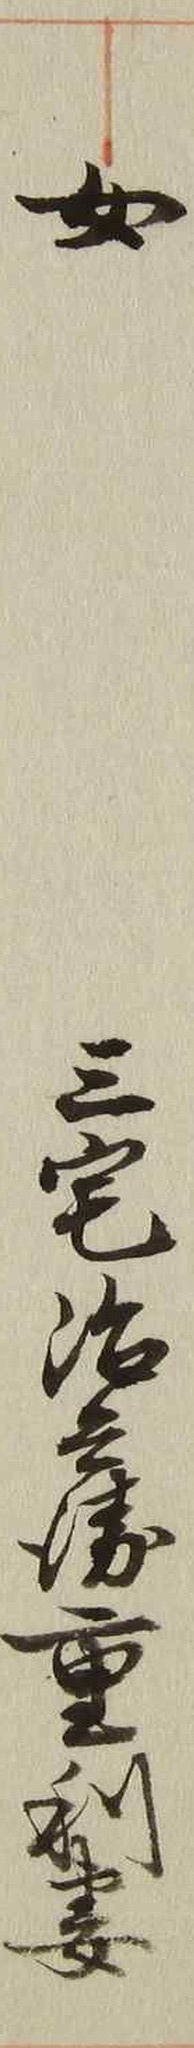女三宅治兵衛重利妻
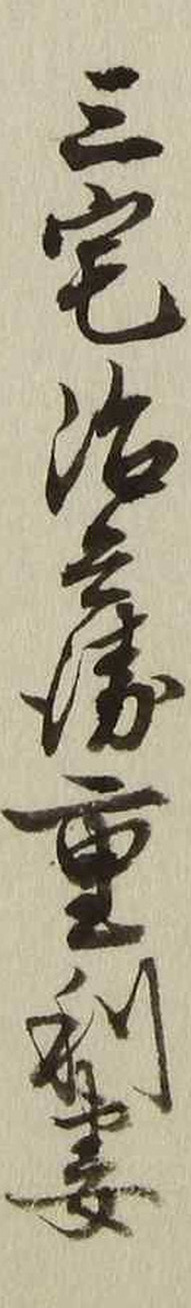女三宅治兵衛重利妻
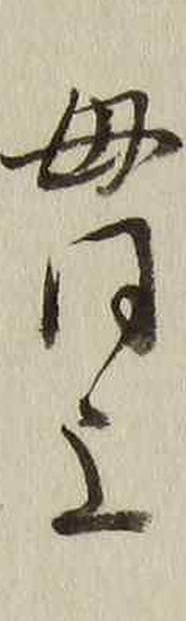母同上
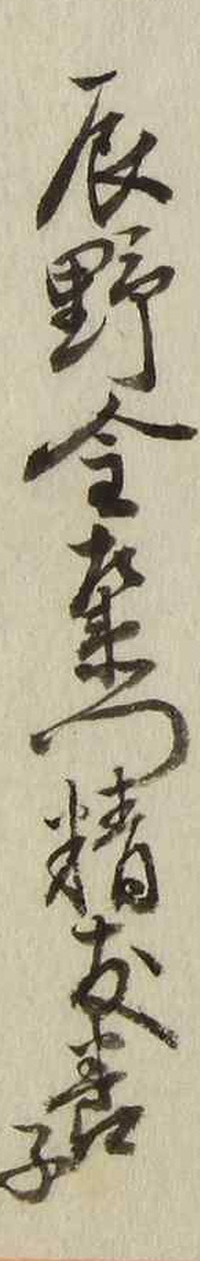辰野金左衛門精友養子
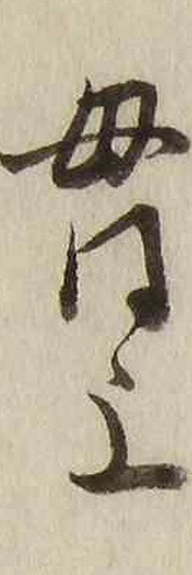母同上

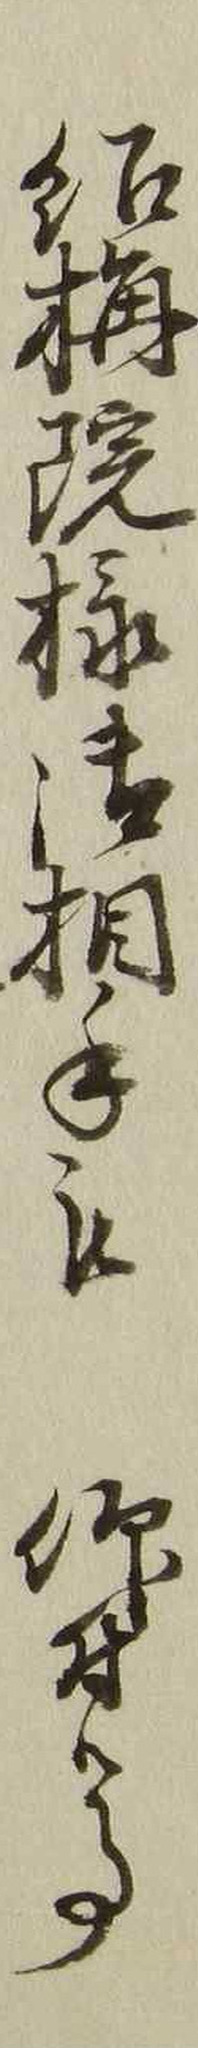紹栴院様御相手被仰付候事
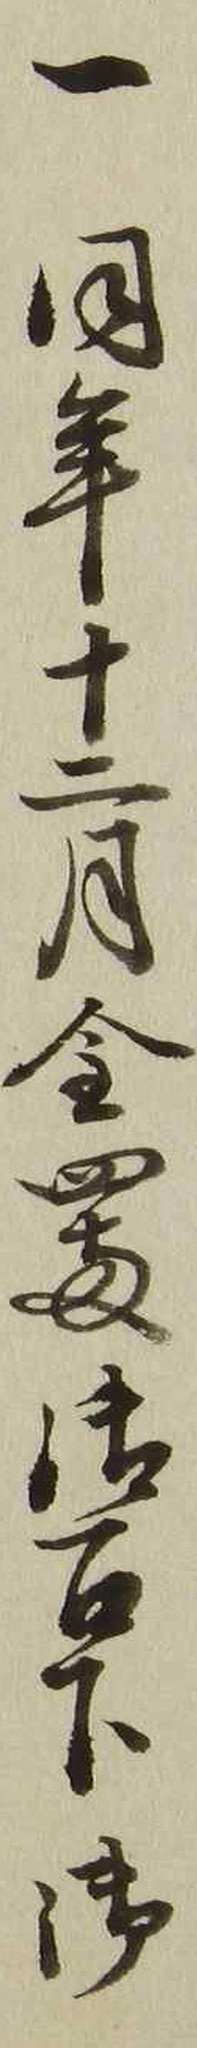一同年十二月金四両御召下御
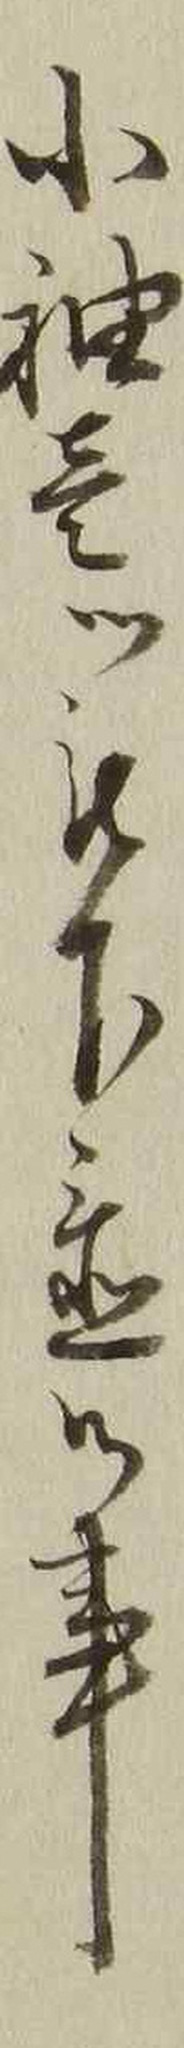小袖壱ッ被下置候事
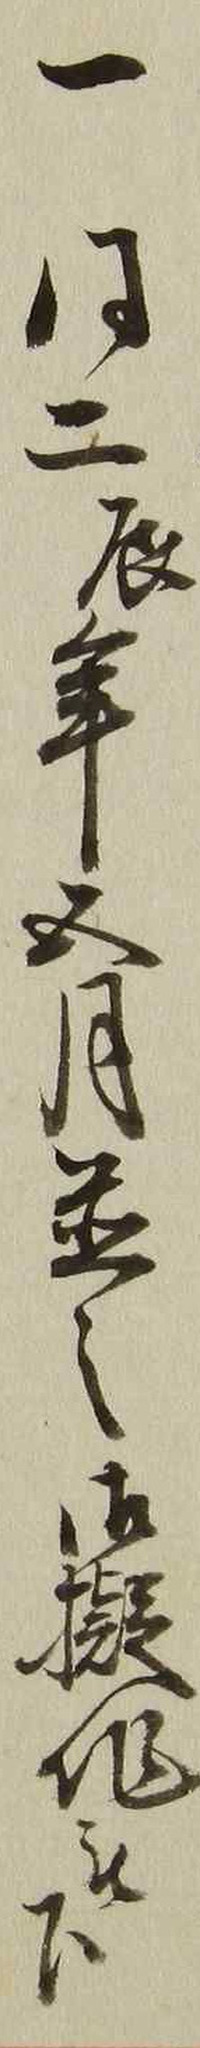一同二辰年五月並之御擬作被下
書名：諸士系譜　巻之31　い之部31
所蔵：会津若松市立会津図書館
